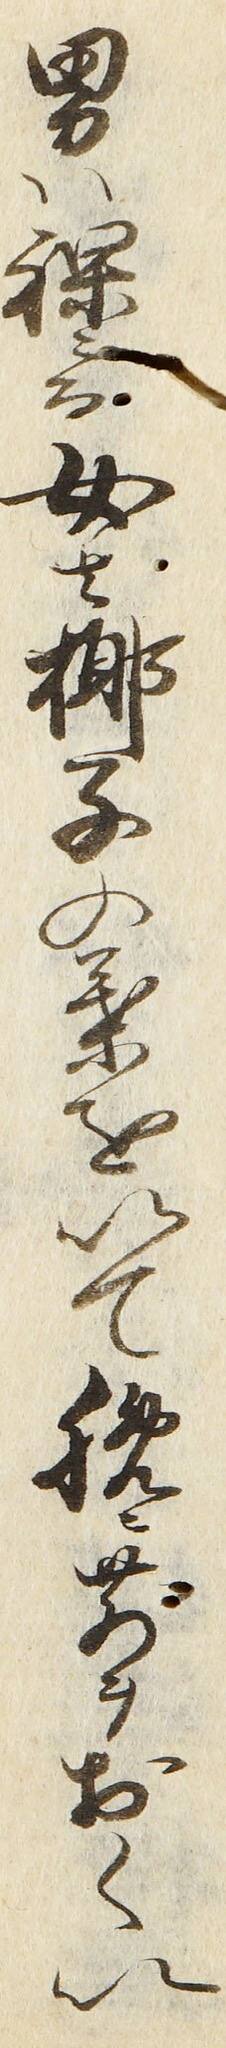男ハ裸ニ而女者椰子の葉を以て纔ニ前ヲおゝい
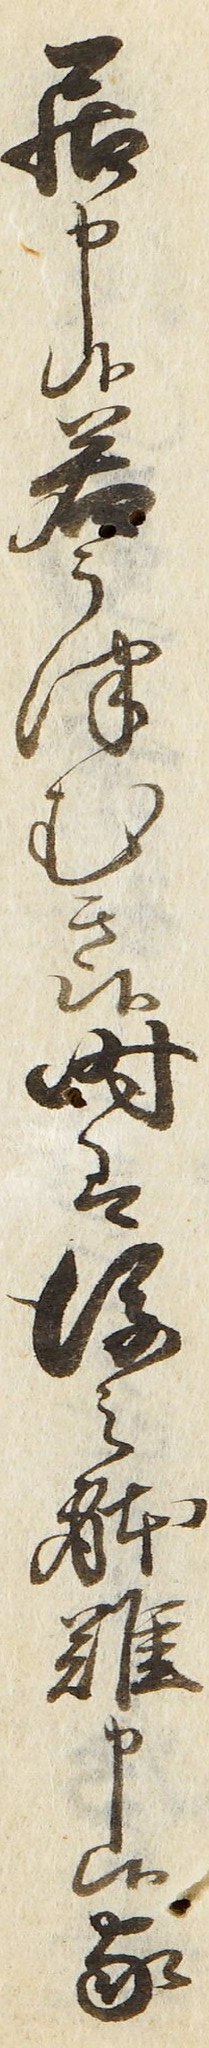居申候若うつむき候時は後之躰難申候家
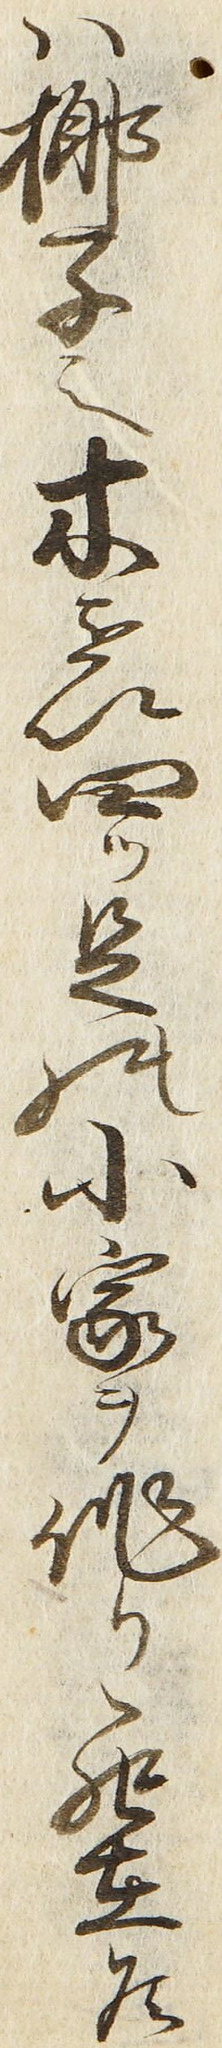ハ椰子之木を以四ツ足之小家ヲ作り罷在候
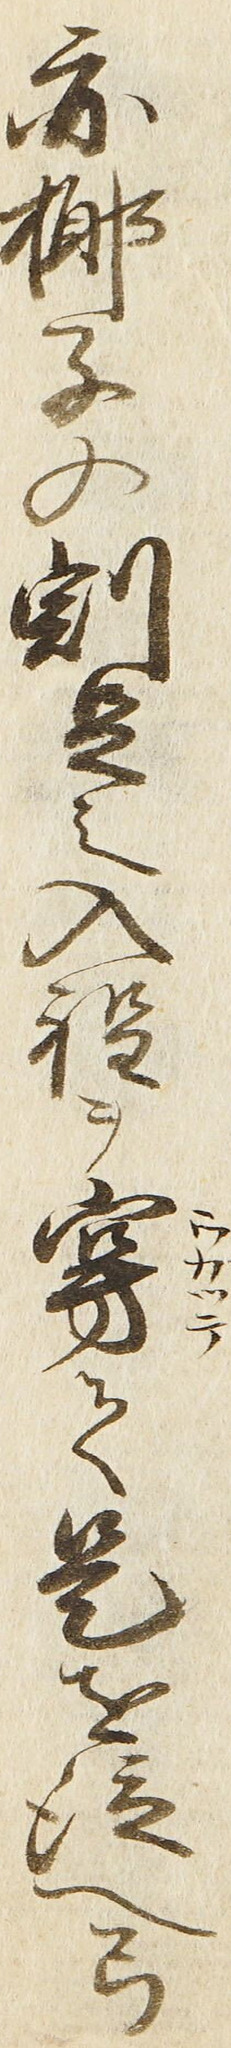亦椰子の割足之入程ヲ穿て是を従へ弓
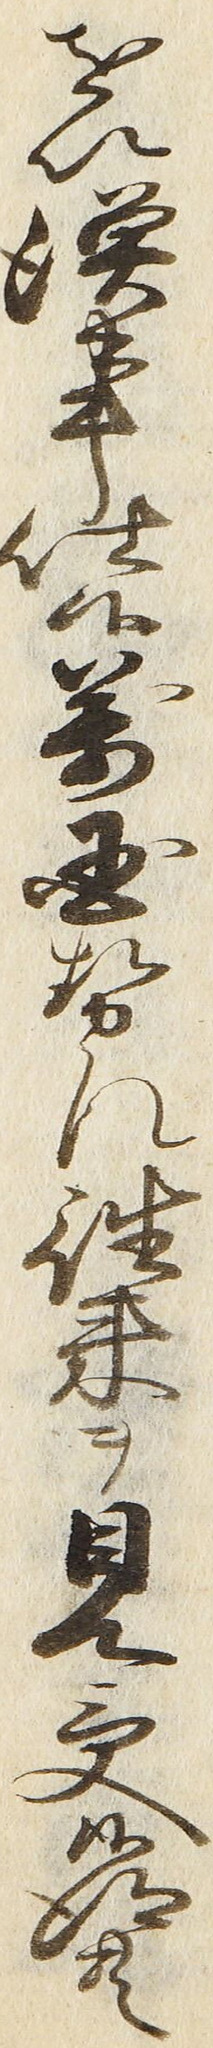を以漁事仕候萬国せん往来ヲ見受候得共
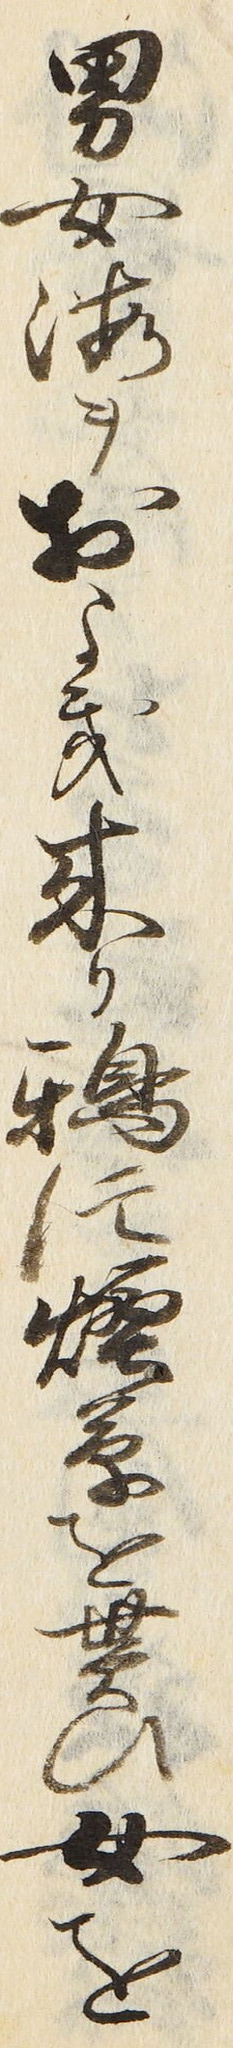男女海ヲおよき来り鴉片煙草を貰ひ女を
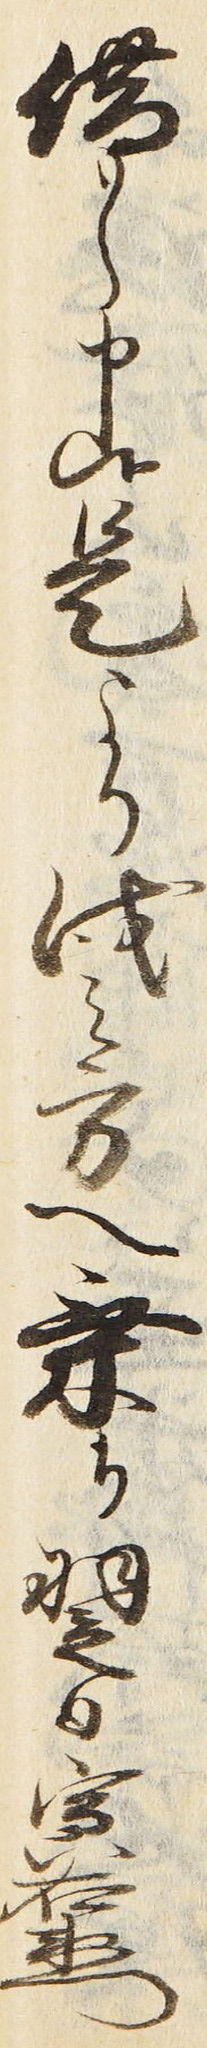借り申候是より戌之方へ乗り翌日寅右衛門
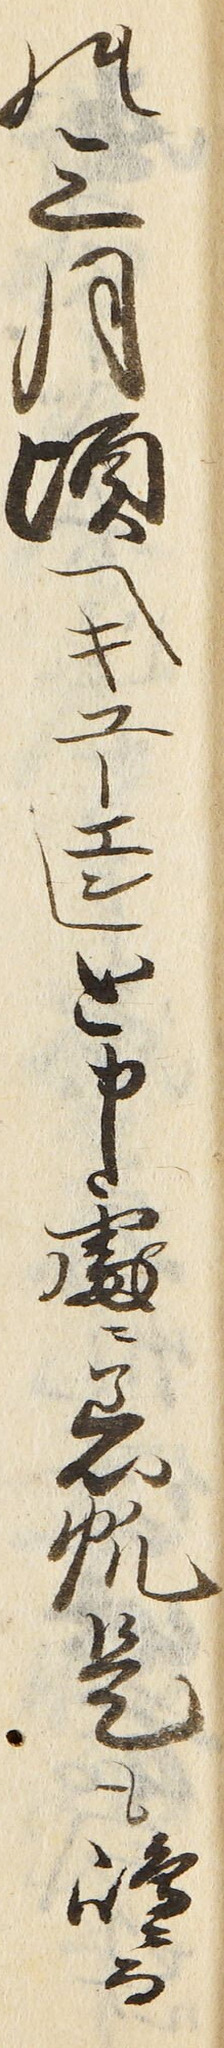の三月頃「キユーエン」と申處ニ着帆是も嶋ニ而
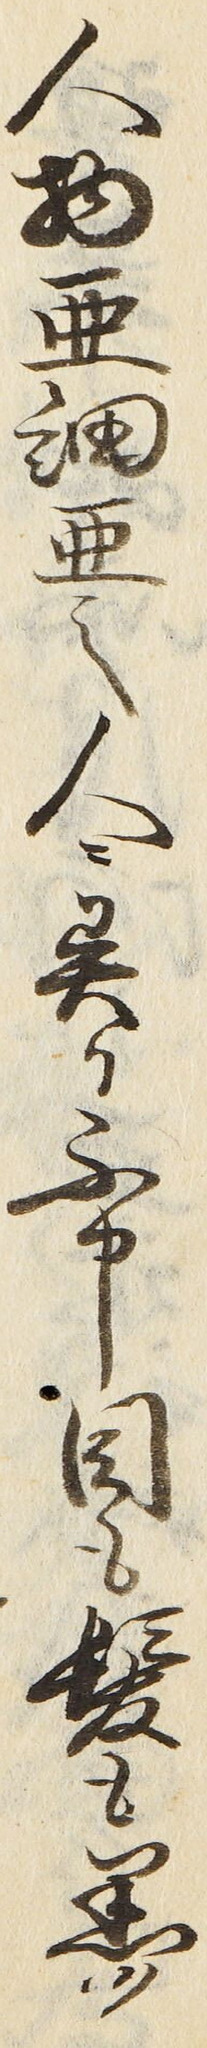人物亜細亜之人ニ異り不申目も髪も黒ク
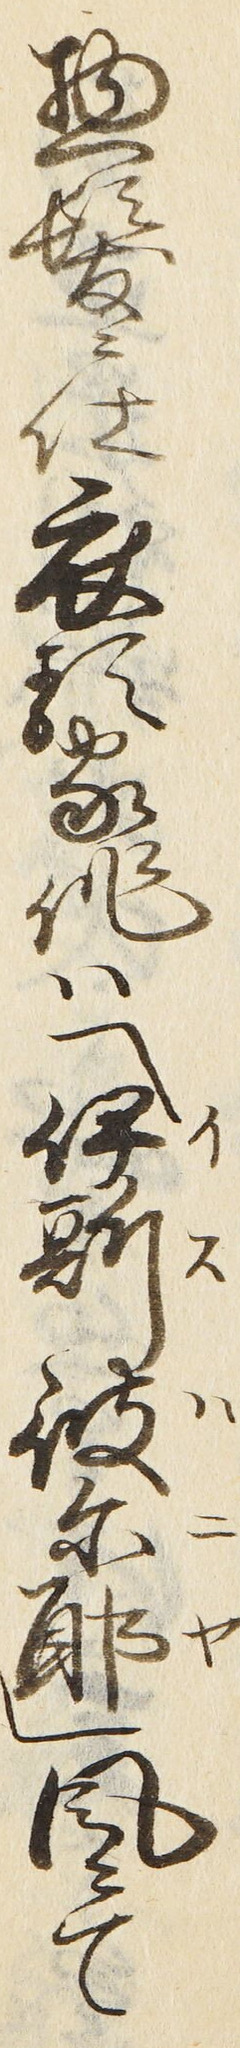惣髪二仕衣類家作ハ「伊斯彼尓耶」風ニて
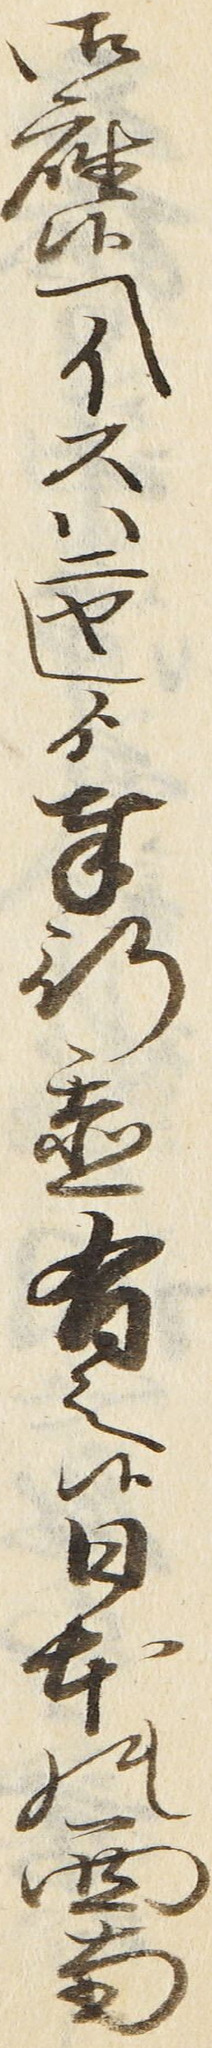御座候「イスハニヤ」ゟ奉行置有之候日本の西南
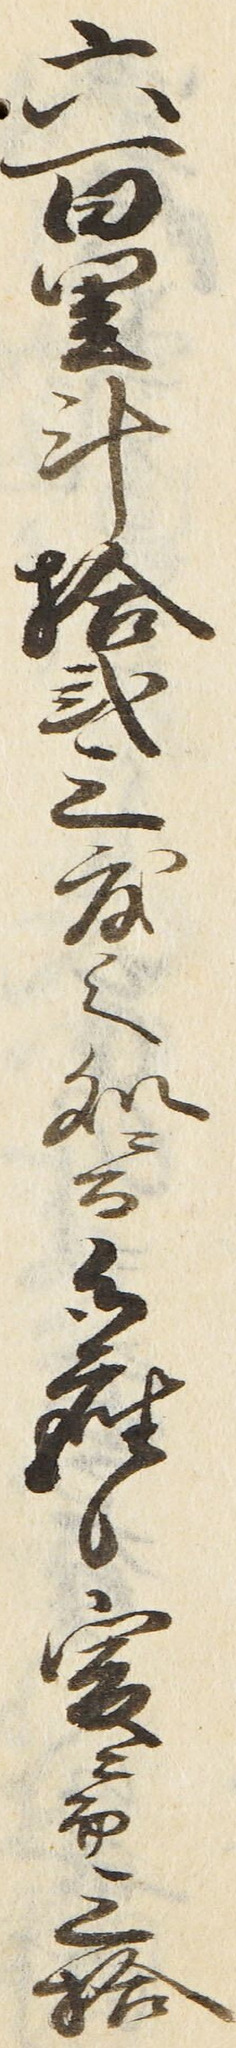六百里斗拾弐三度之処ニ而御座候爰ニ而三拾
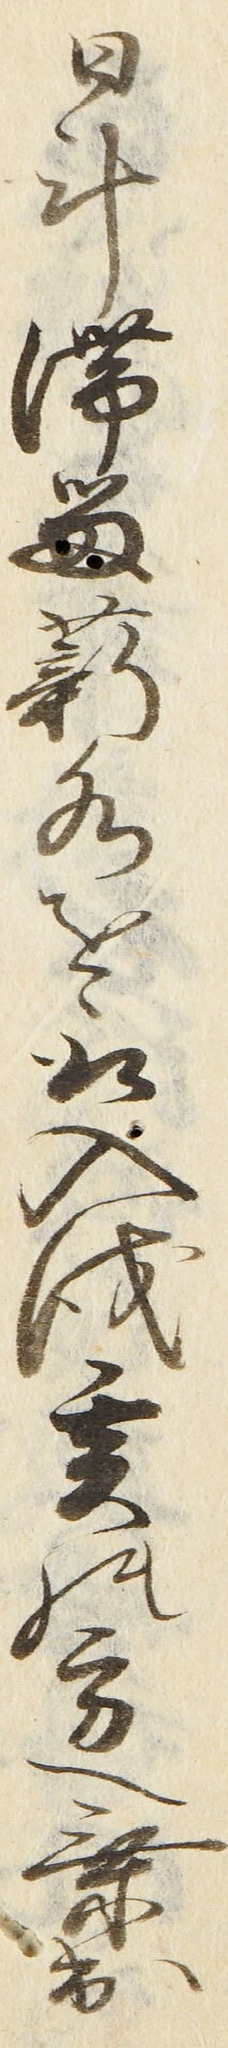日斗滞留薪水を取入戌亥の方へ乗出
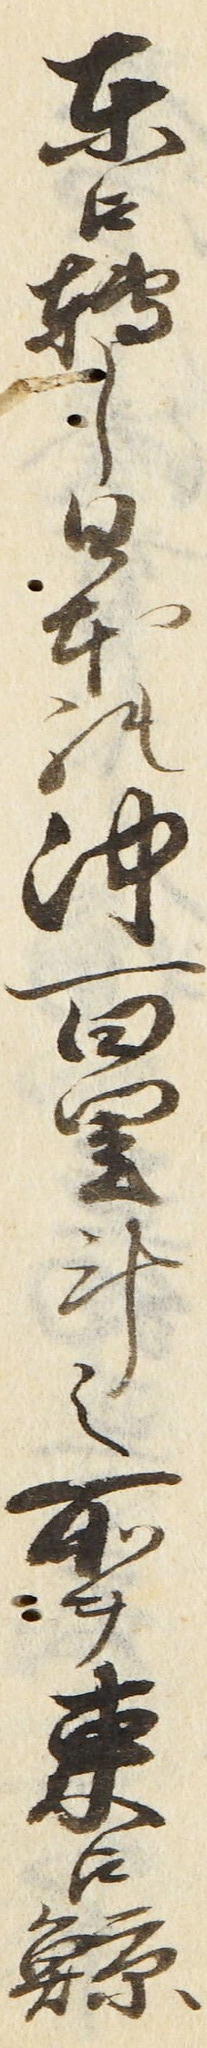東江轉し日本の沖百里斗之所ヲ東江鯨
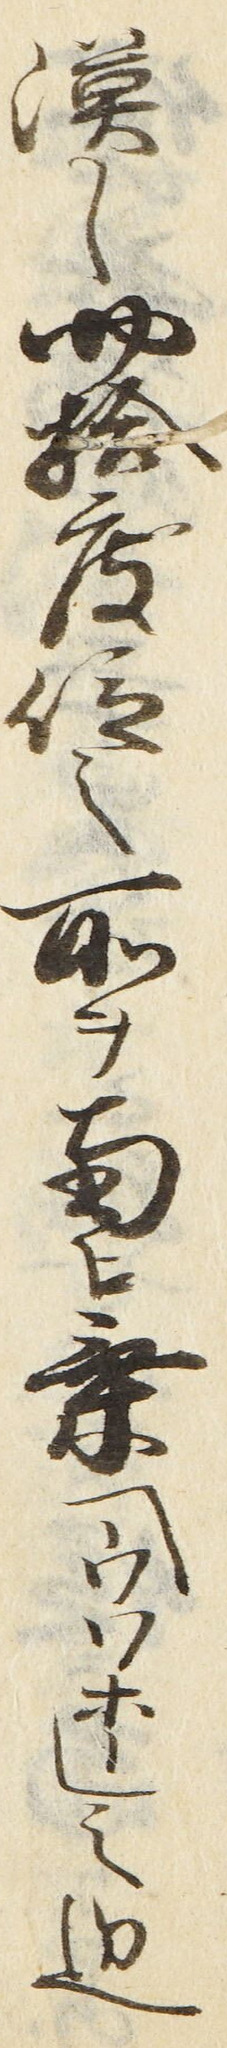漁し四拾度位之所ヲ南江乗「ウワホー」之辺
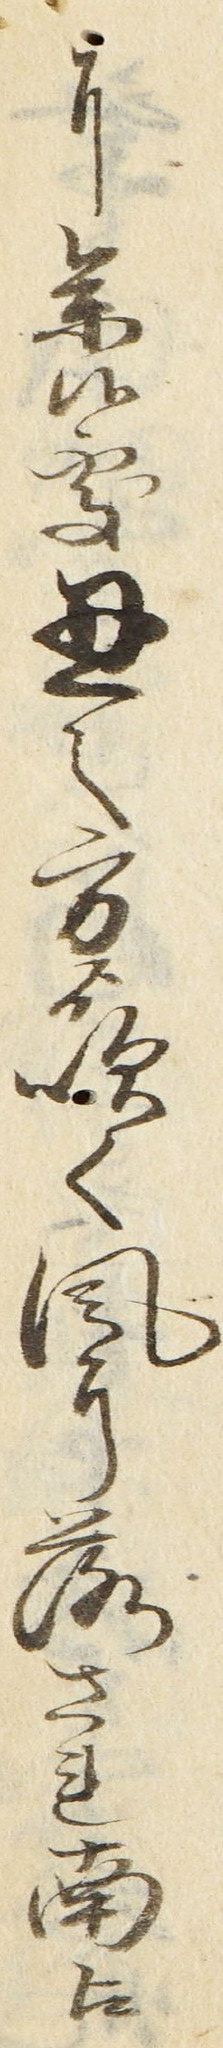に参候處丑之方ゟ吹く風に落され南江
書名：漂客談寄
